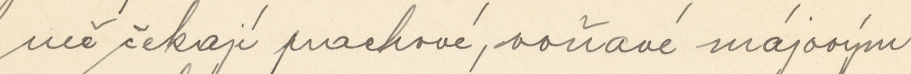mě čekají prachové, voňavé májovým
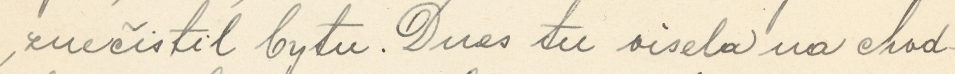znečistil bytu. Dnes tu visela na chod-
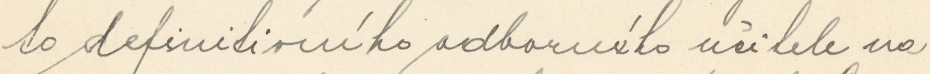to definitivního odborného učitele na
